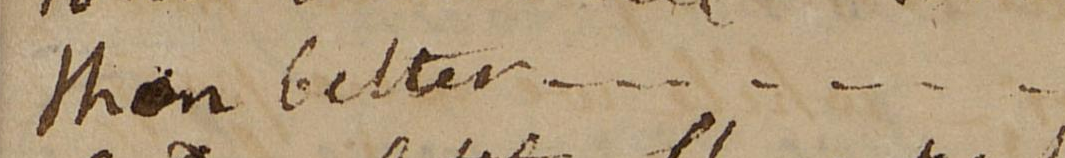than better-- ----
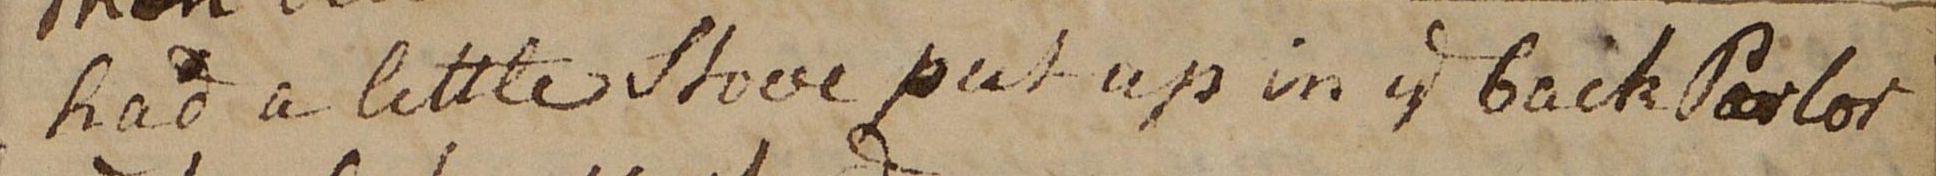had a little Stove put up in y^e back Parlor
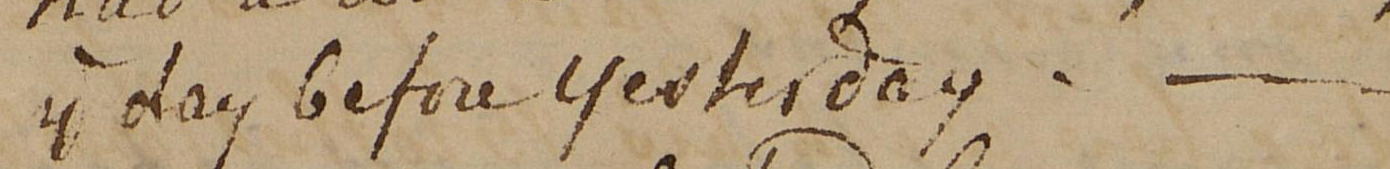y^e day before yesterday.-
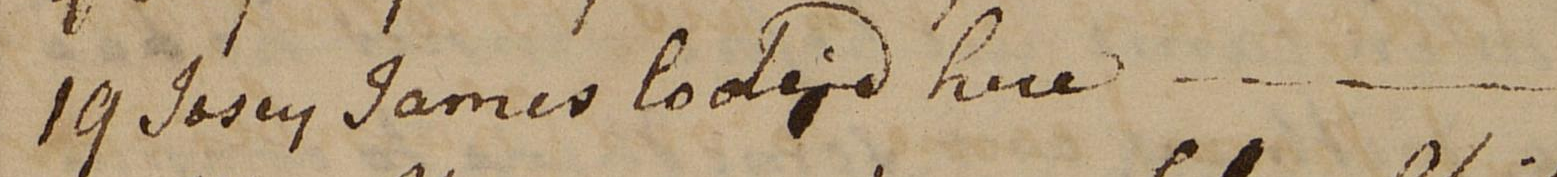19 Josey James lodg'd here---
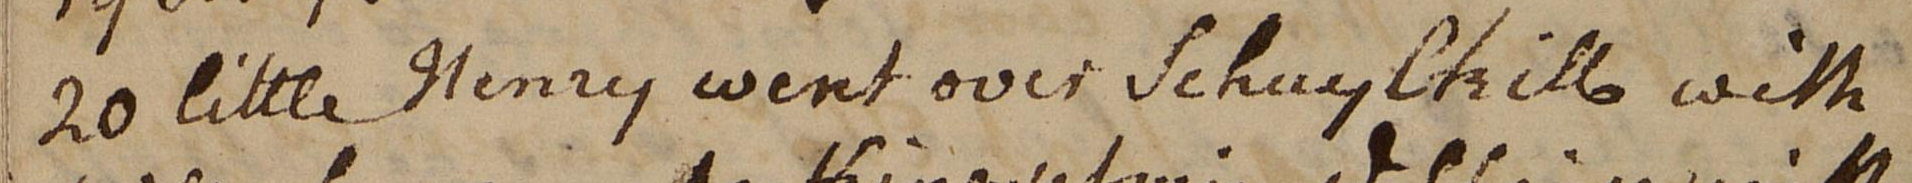20 little Henry went over Schuylkill with
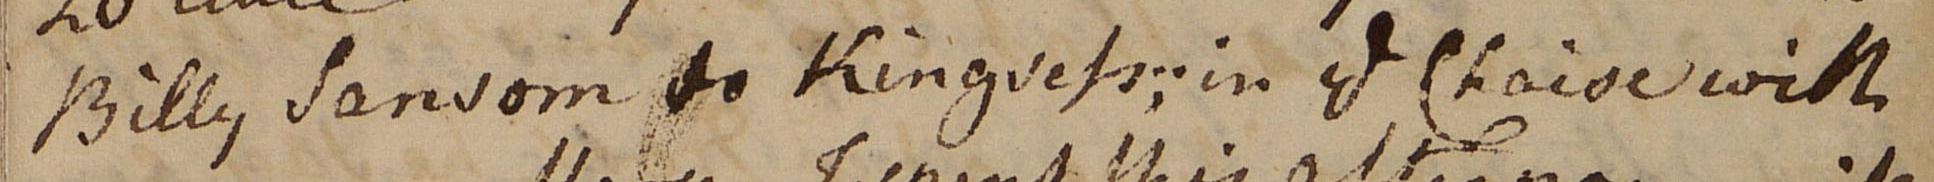Billy Sansom to Kingsess: in y^e Chaise with
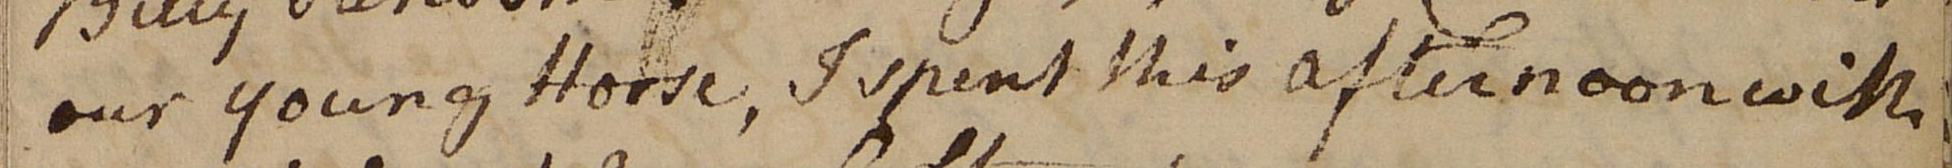our young Horse, I spent this afternoon with
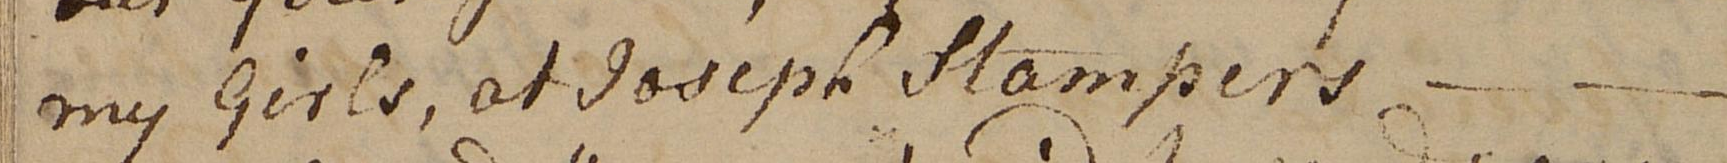my Girls, at Joseph Stampers--
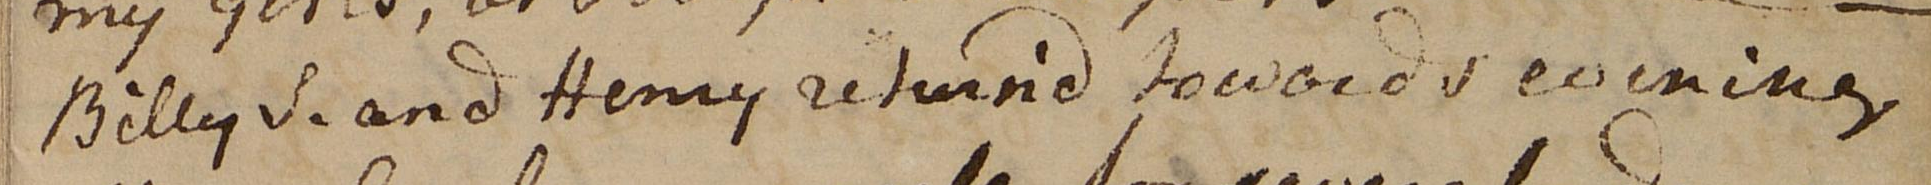Billy S. and Henry return'd towards evining
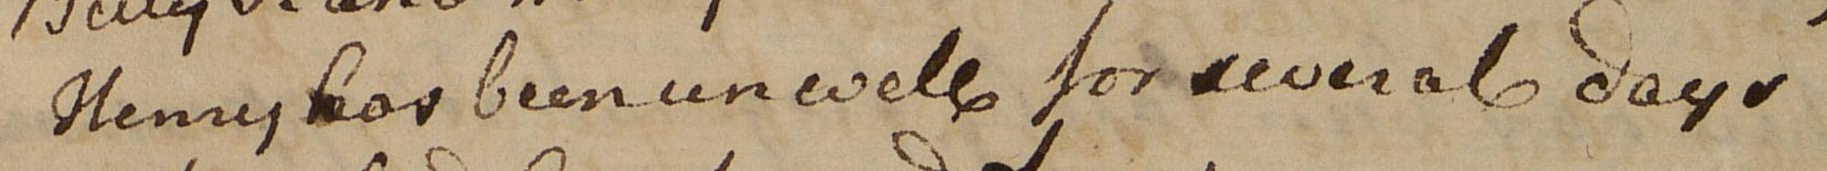Henry has been unwell for several days
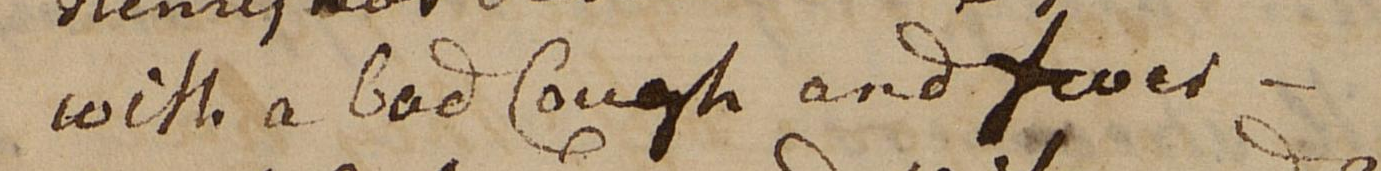with a bad Cough and fever-
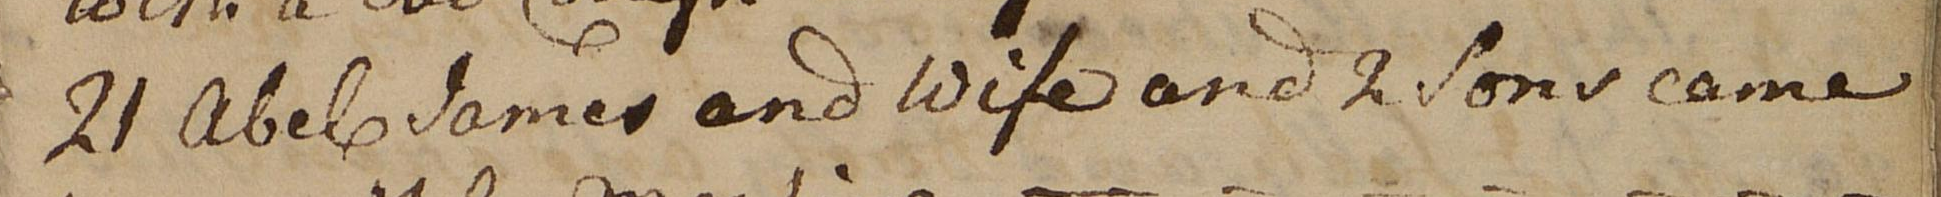21 Abel James and Wife and 2 Sons came
